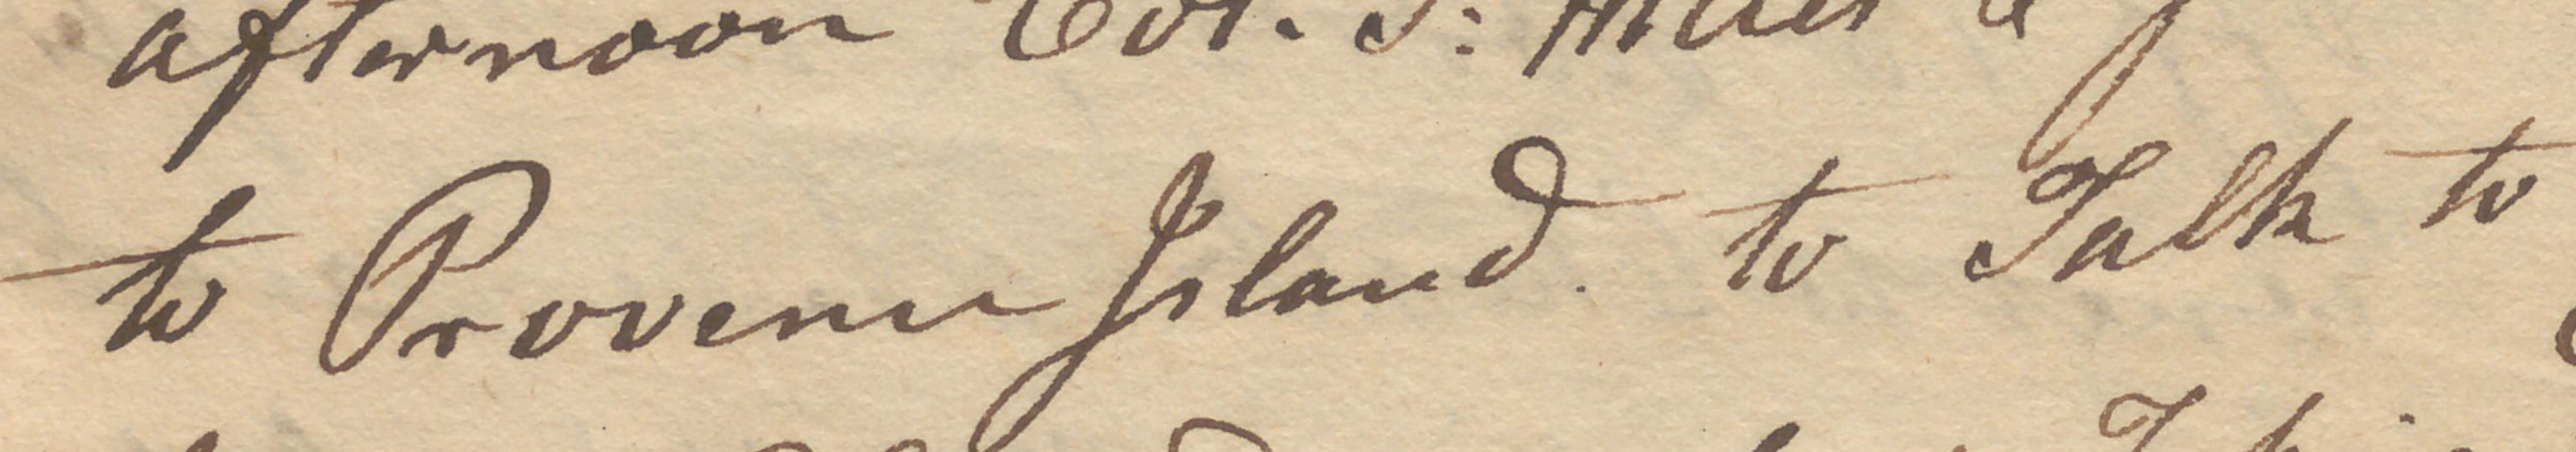to Provence Island. to Talk to
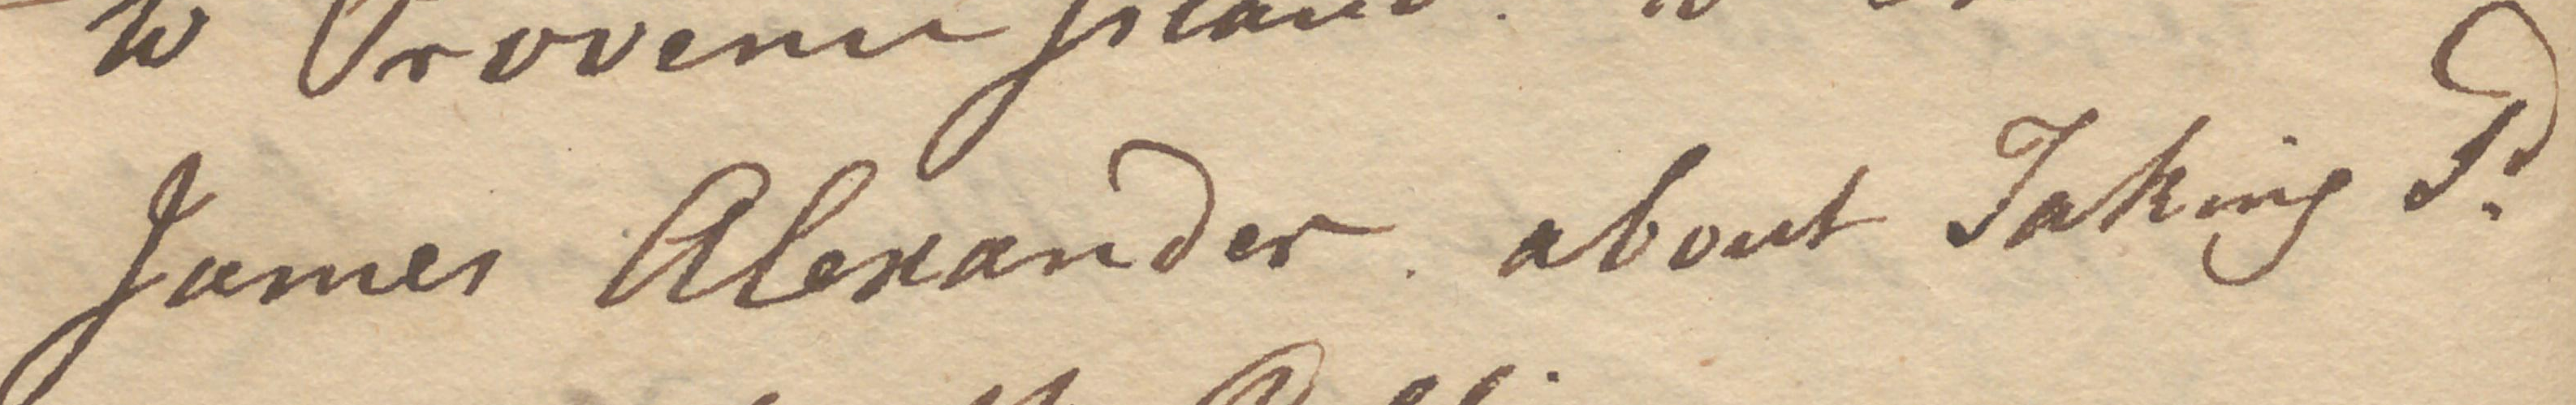James Alexander about Taking s^d.
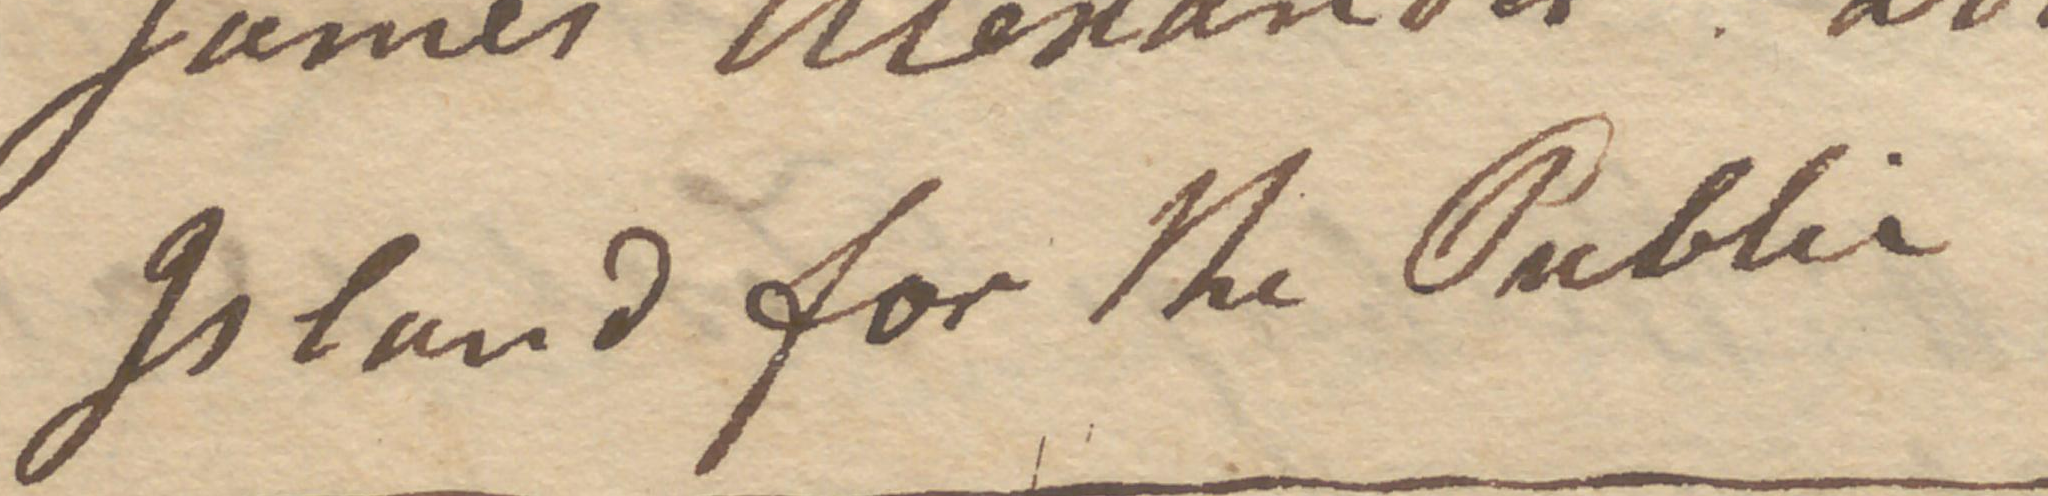Island for the Public
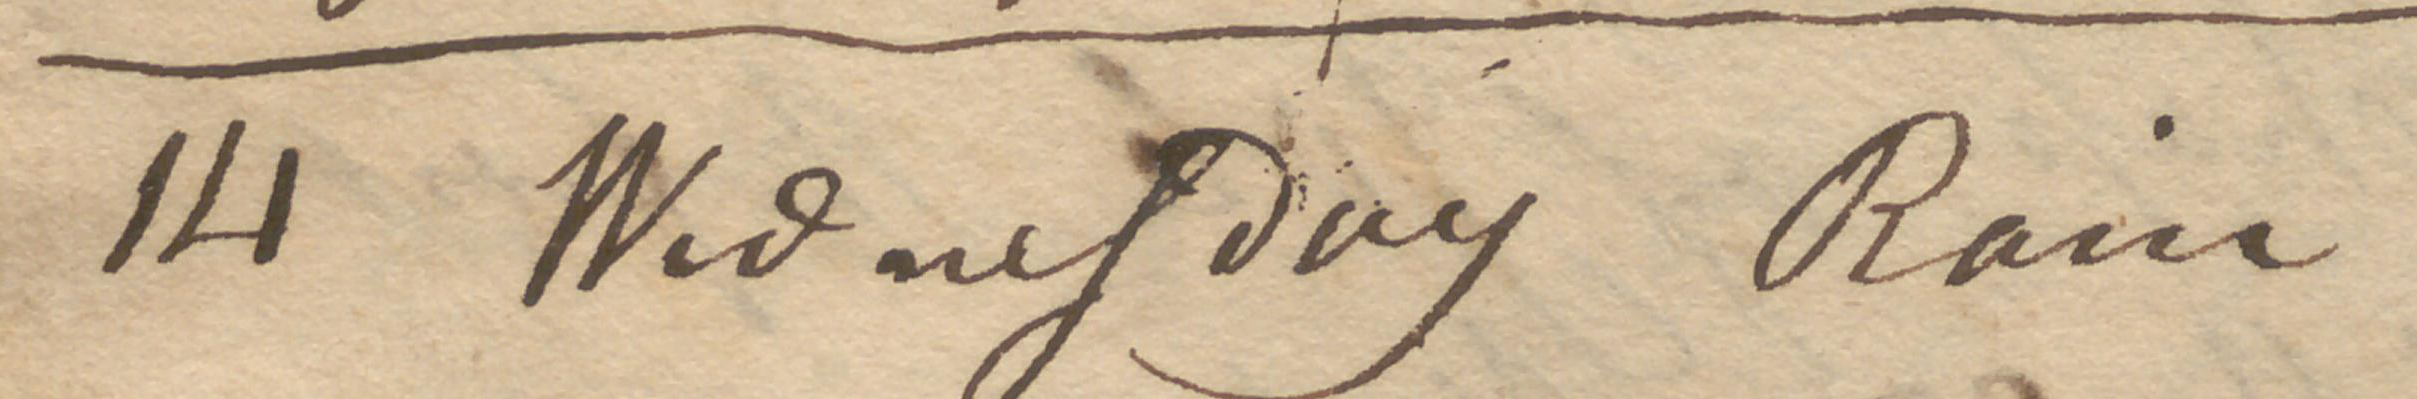14 Wednesday Rain
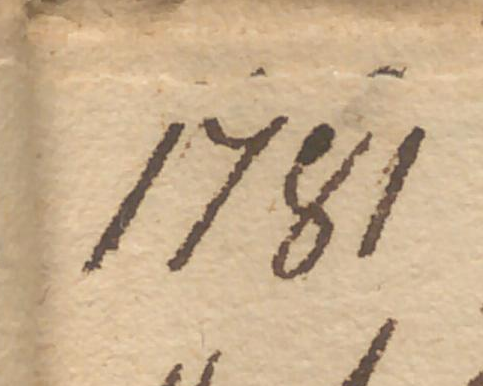1781
